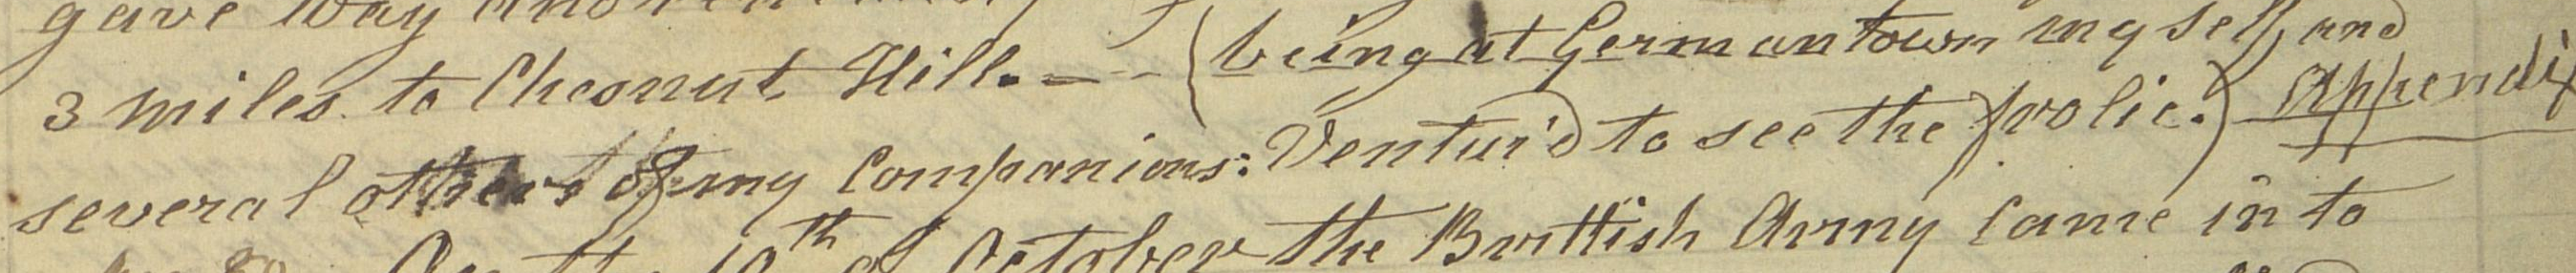several others of my Companions: Ventur'd to see the frolic) Appendix
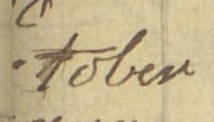-tober
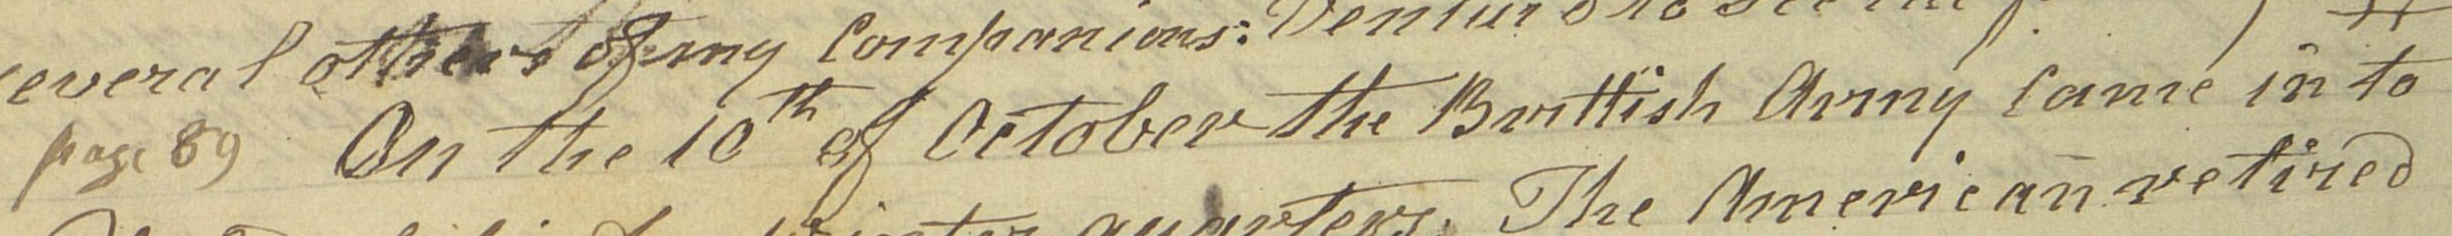page 89 On the 10^th of October the Brittish Army came in to
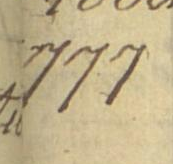1777
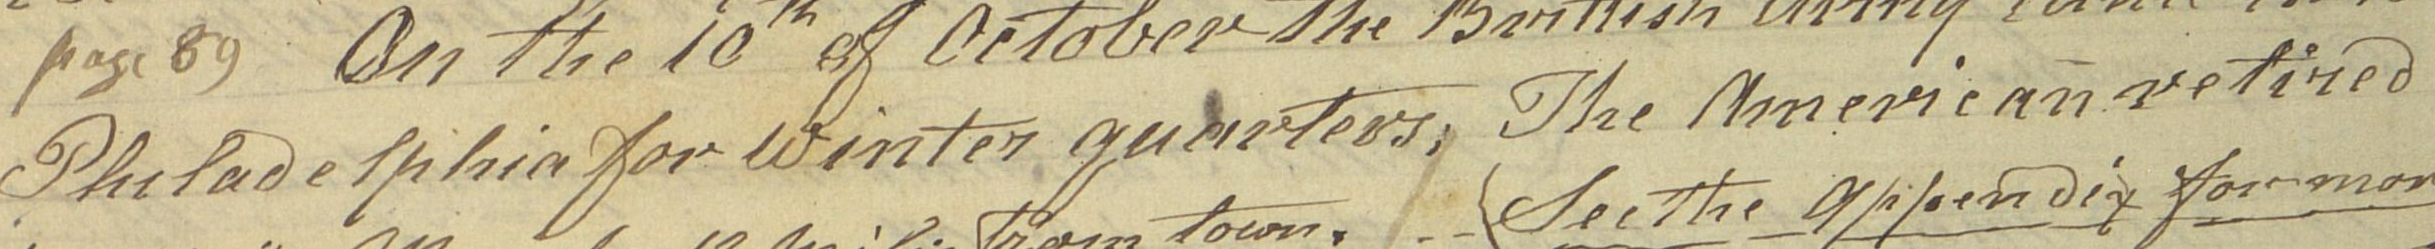Philadelphia for Winter quarters; The American retired
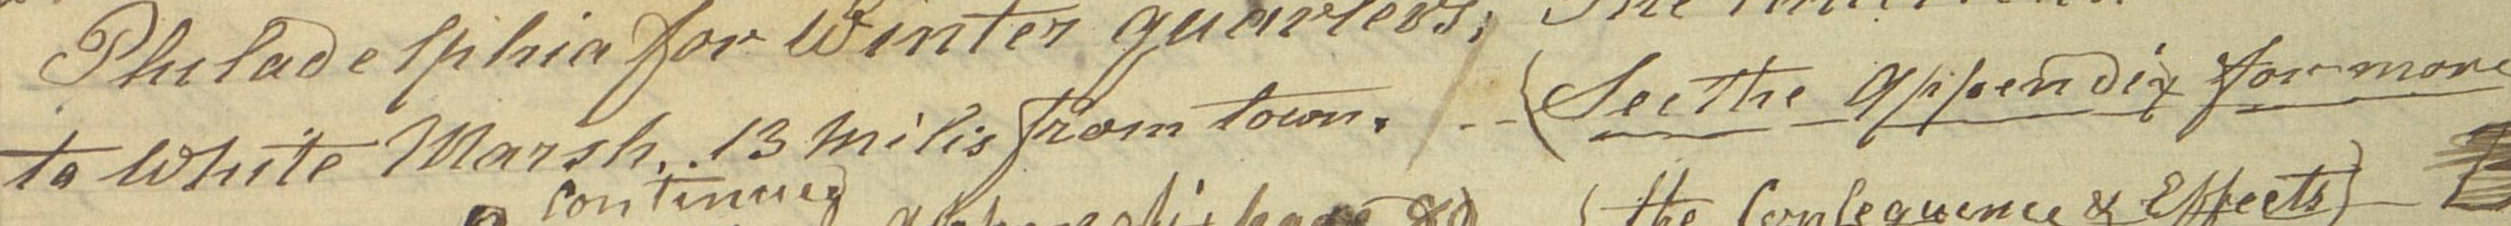to White Marsh, 13 Miles from town. (See the Appendix for more
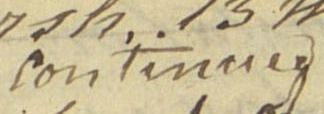continued
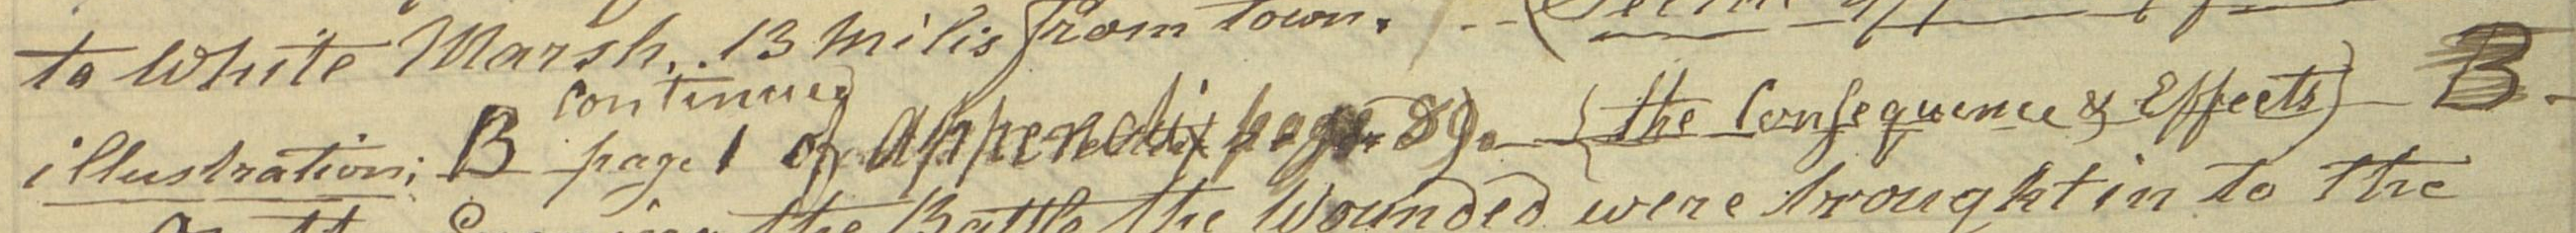illustration; B page 1 of Appendix page 80) (the Consequence & Effects) B
